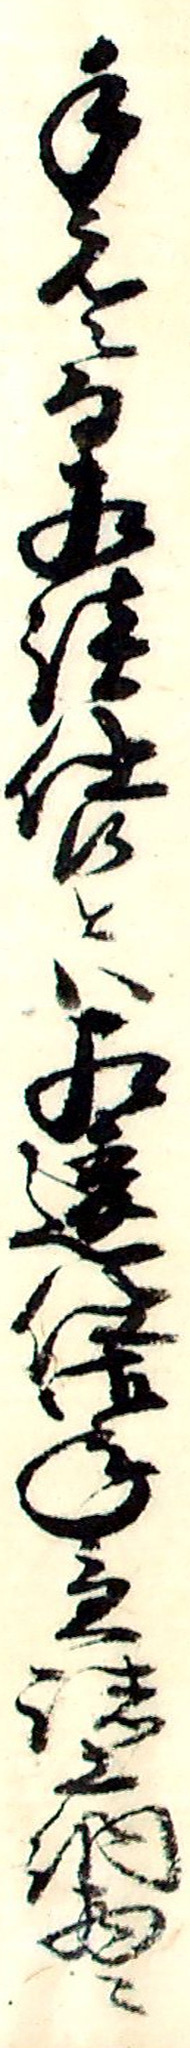手元ニ而相談仕候とハ相違仕御年貢諸上納物ニ
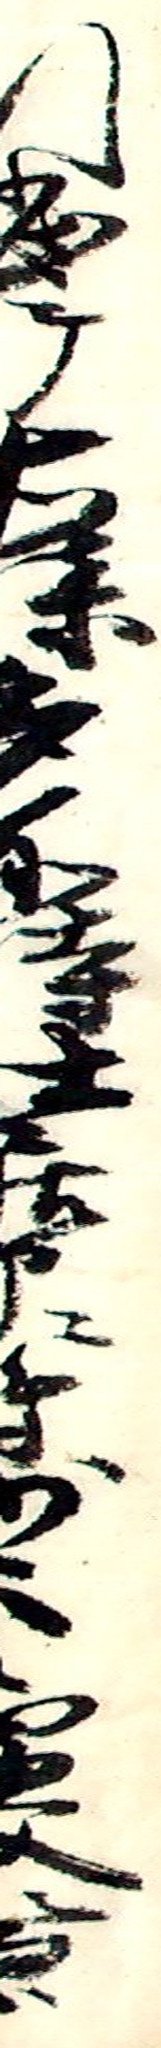引當テ右漆多所持仕居申ニ付少々之買入ニ而ハ

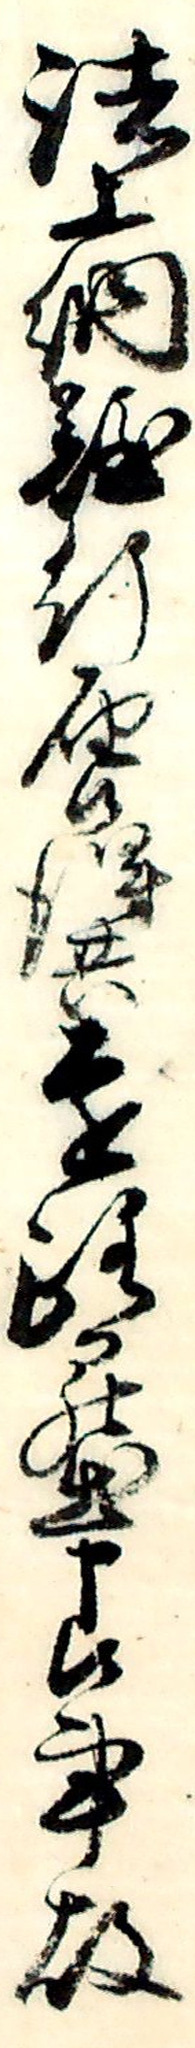諸上納難行届候得共遠路罷出候事故
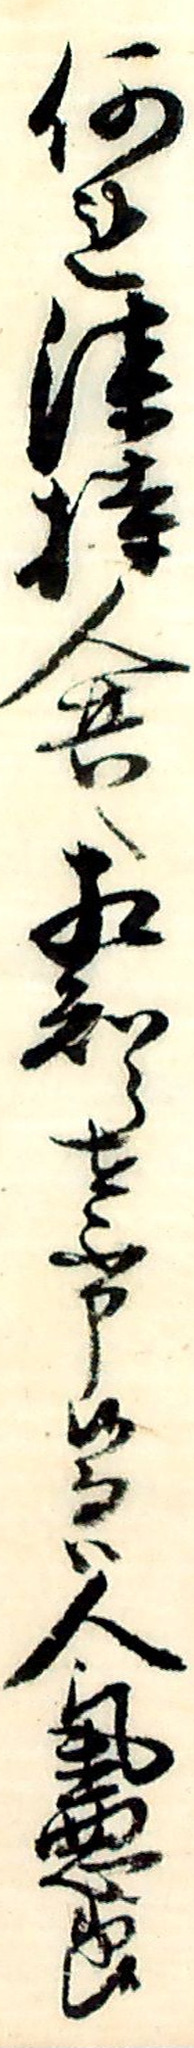何れ漆持人共へ相知らせ不申候而ハ人気悪布候
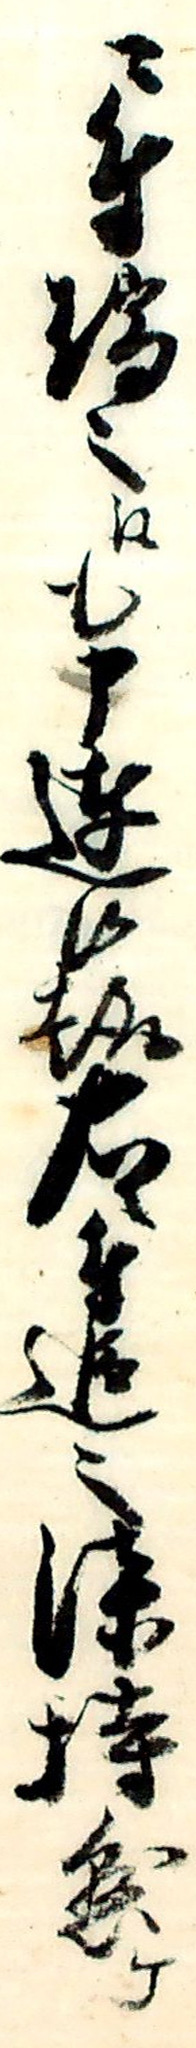ニ付端々江も申達候趣右ニ付追々漆持懸ケ
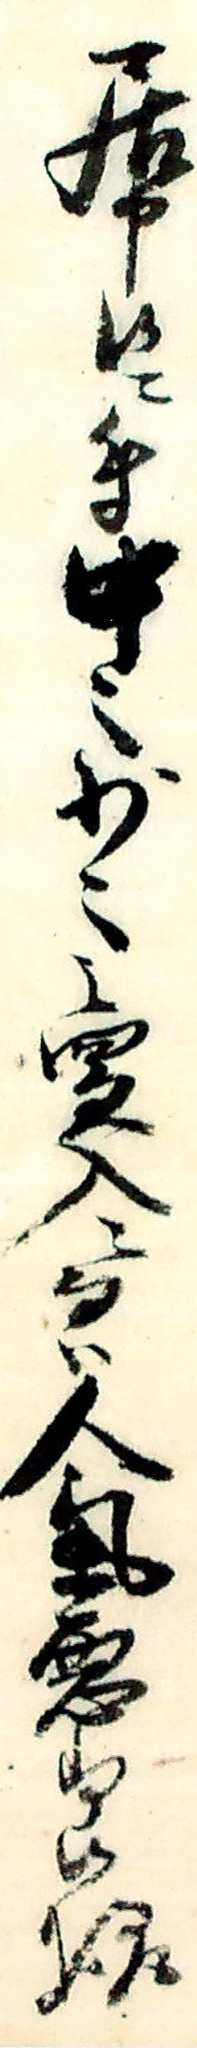居申候ニ付中々少々之買入ニ而ハ人気悪布候様
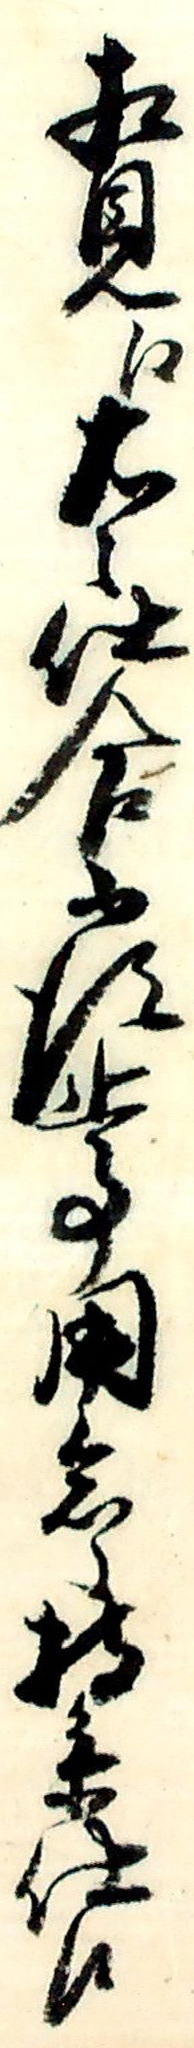相見江右之仕合不得止事用意ニ持参仕候
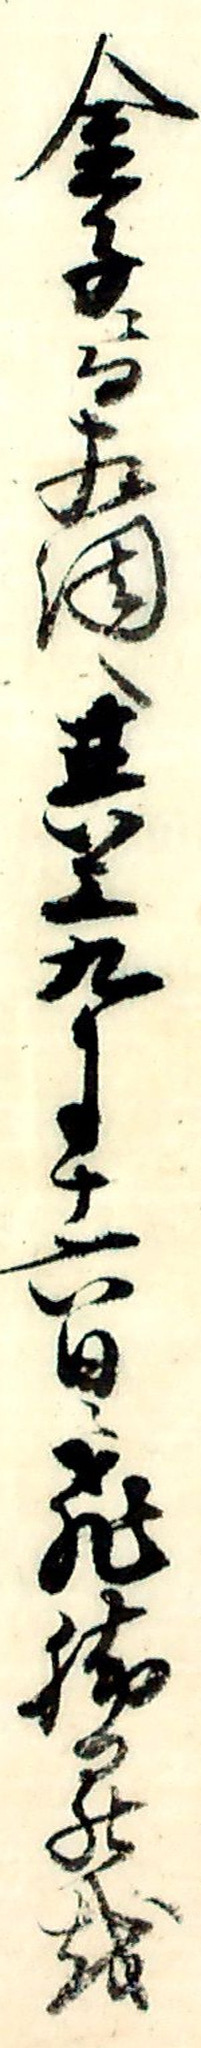金子ニ而相調へ其上九月十六日ニ飛脚罷越
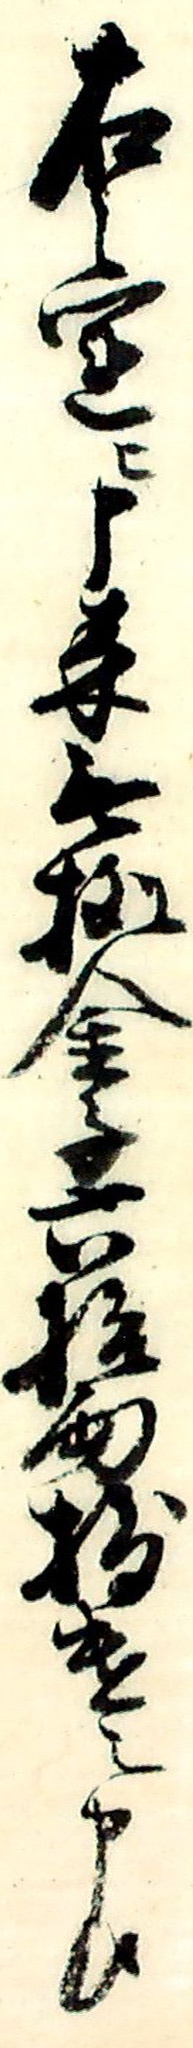右之運ひ申来無拠金子六拾両指遣し申候
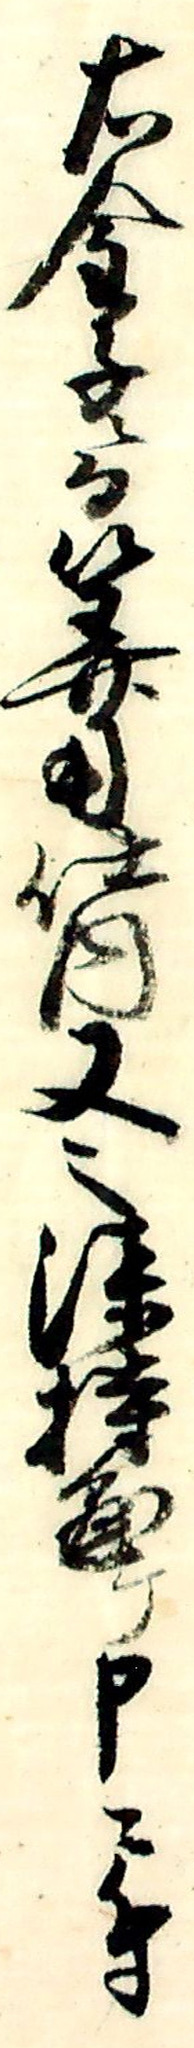右金子ニ而算用仕内又々漆持懸ケ申ニ付
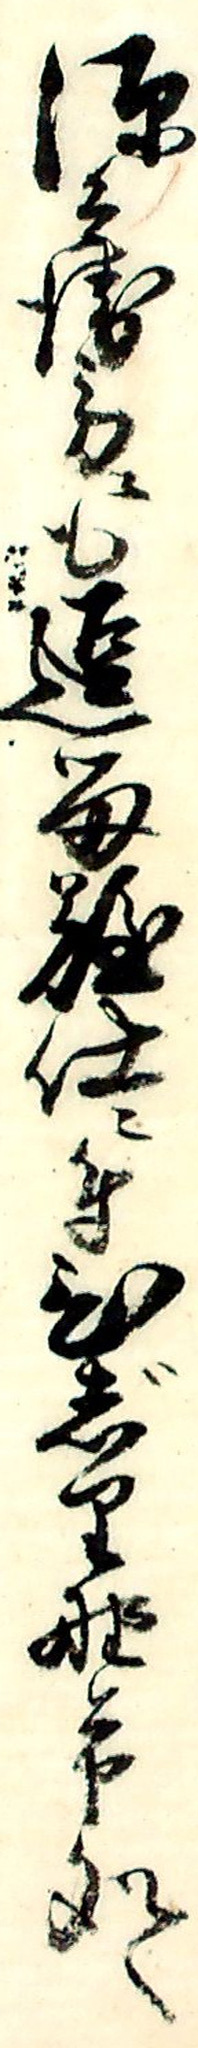源兵衛方ニも逗留難仕ニ付ひじり野と申処へ
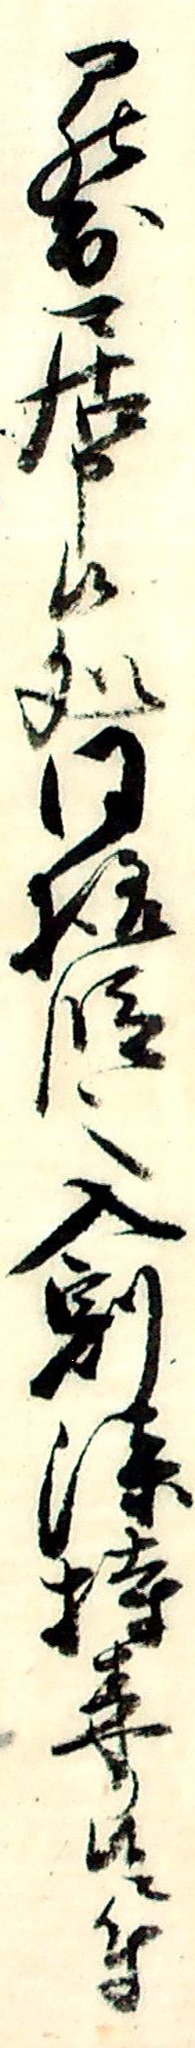罷出居申候処同様段々入割漆持来り候ニ付
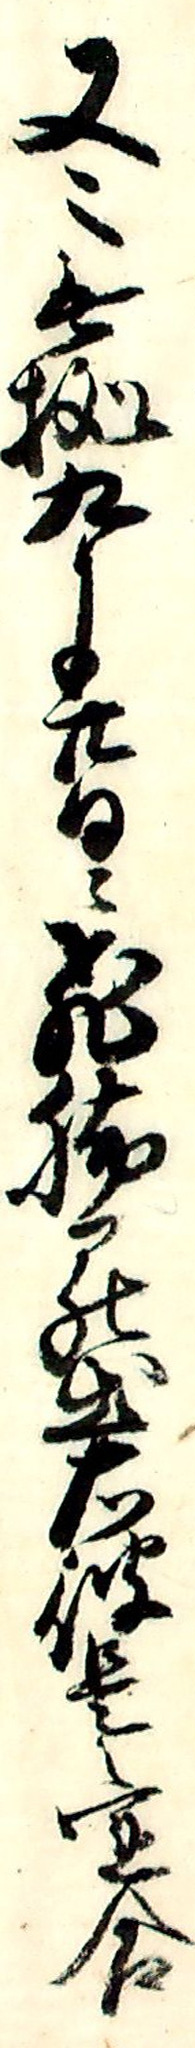又々無拠九月廿日ニ飛脚罷出右彼是之運合
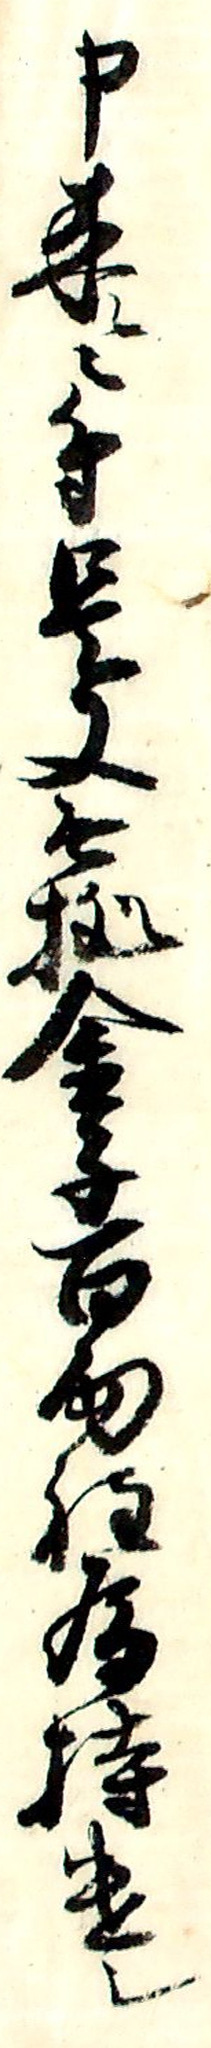申来候ニ付是又無拠金子百両程為持遣シ
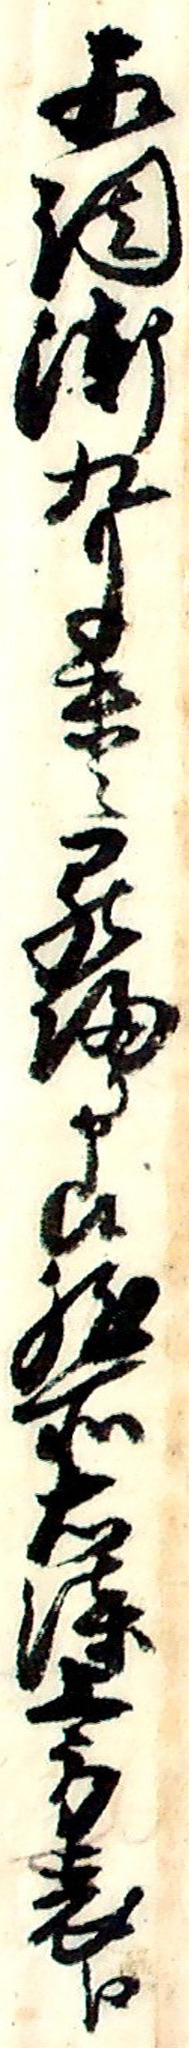相調漸九月末ニ罷帰り申候然所右漆上方表江
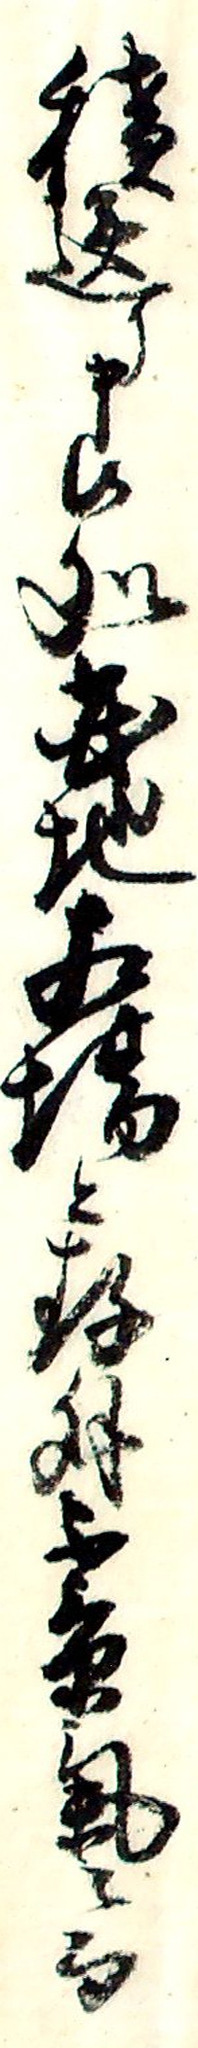積送り申候処當地相場者存外不景気ニ而
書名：奉申上覚（山城谷漆仕入買入銀主之義に付）
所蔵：鳴門教育大学 Naruto University of Education
